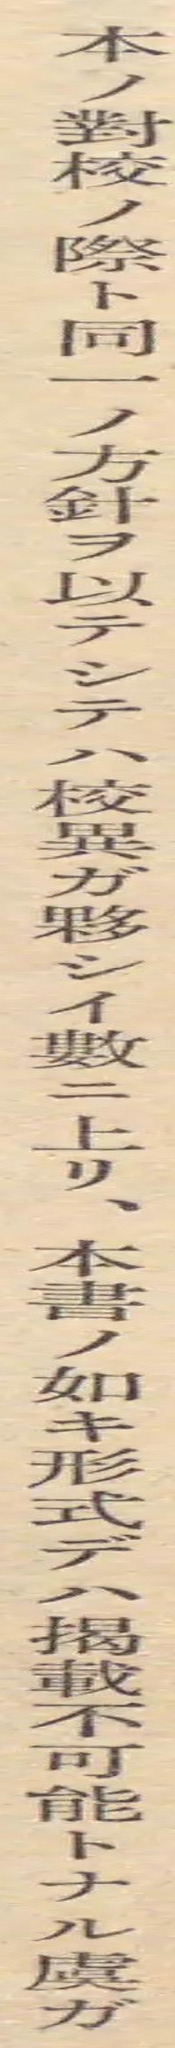本ノ対校ノ際ト同一ノ方針ヲ以テシテハ校異ガ夥シイ数ニ上リ、本書ノ如キ形式デハ掲載不可能トナル虞ガ
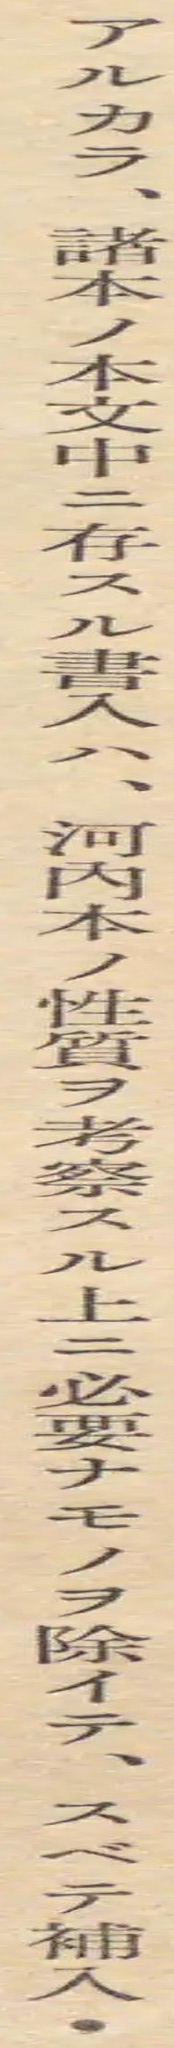アルカラ、諸本ノ本文中ニ存スル書入ハ、河内本ノ性質ヲ考察スル上ニ必要ナモノヲ除イテ、スベテ補入・
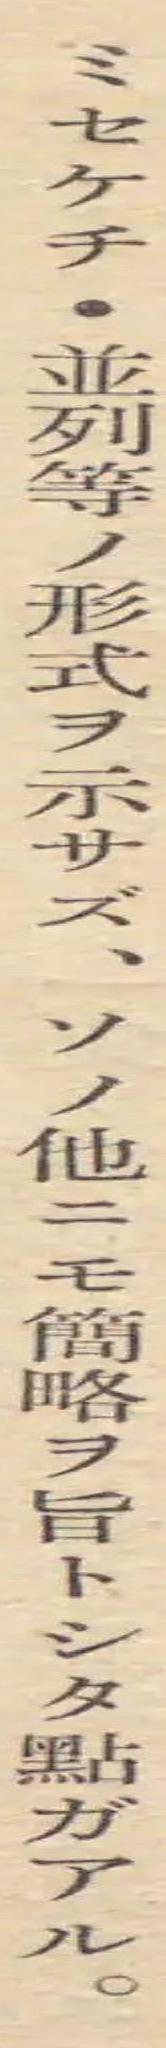ミセケチ・並列等ノ形式ヲ示サズ、ソノ他ニモ簡略ヲ旨トシタ点ガアル。
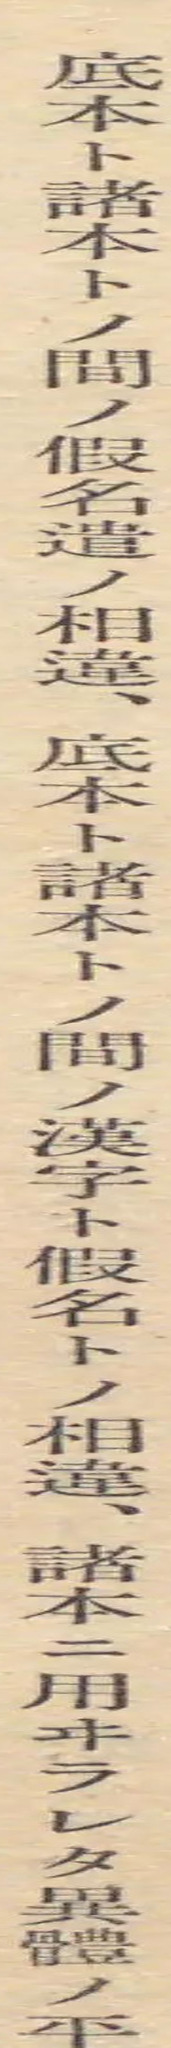一底本ト諸本トノ間ノ仮名遣ノ相違、底本ト諸本トノ間ノ漢字ト仮名トノ相違、諸本ニ用ヰラレタ異体ノ平
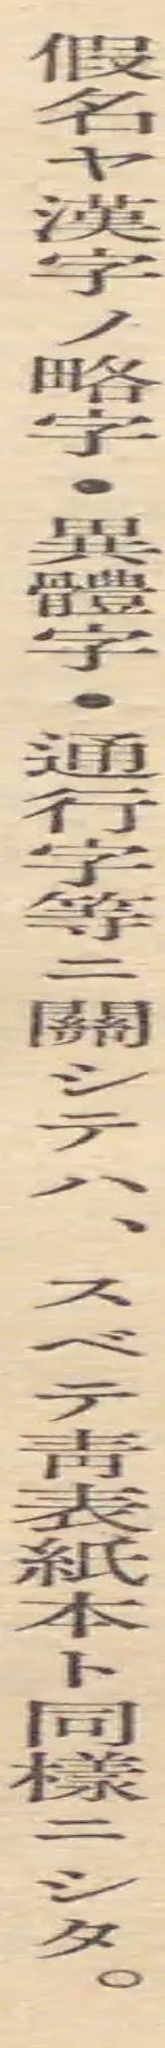仮名ヤ漢字ノ略字・異体字・通行字等ニ関シテハ、スベテ青表紙本ト同様ニシタ。
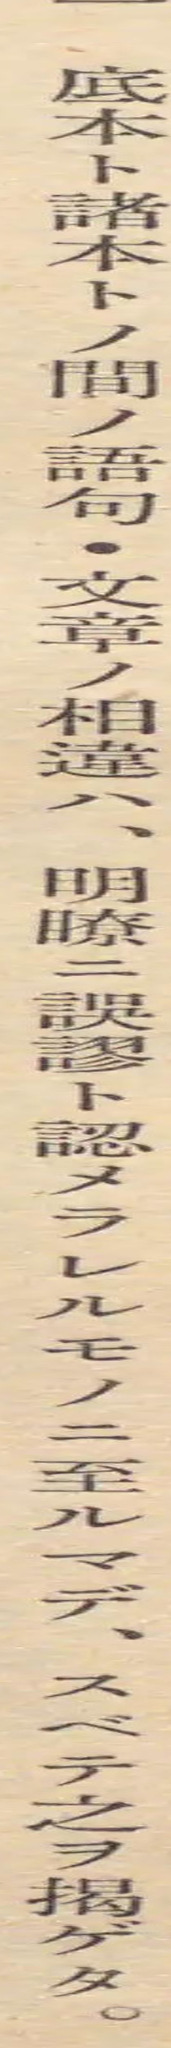一底本ト諸本トノ間ノ語句・文章ノ相違ハ、明瞭ニ誤謬ト認メラレルモノニ至ルマデ、スベテ之ヲ掲ゲタ。
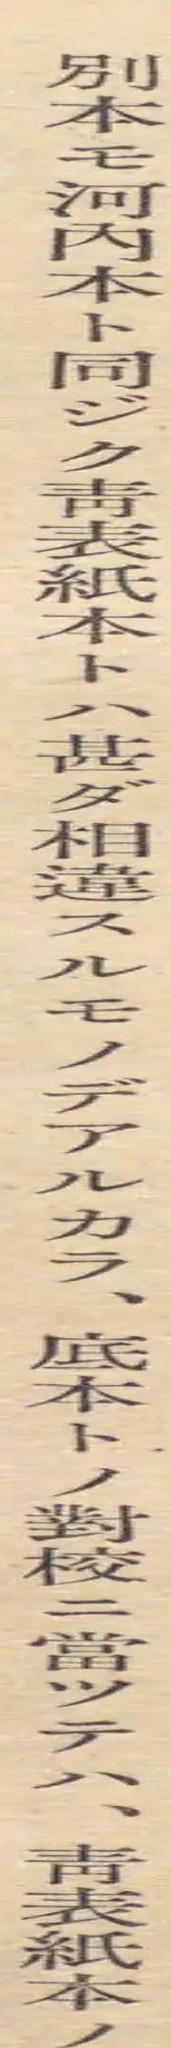一別本モ河内本ト同ジク青表紙本トハ甚ダ相違スルモノデアルカラ、底本トノ対校ニ当ツテハ、青表紙本ノ
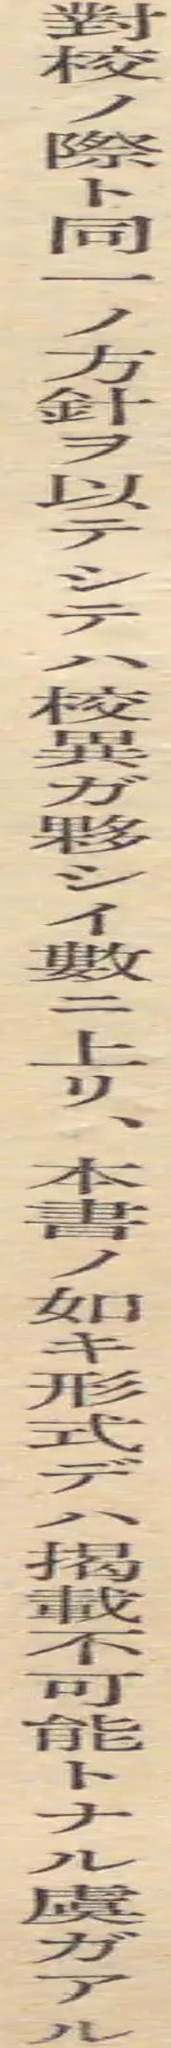対校ノ際ト同一ノ方針ヲ以テシテハ校異ガ夥シイ数ニ上リ、本書ノ如キ形式デハ掲載不可能トナル虞ガアル
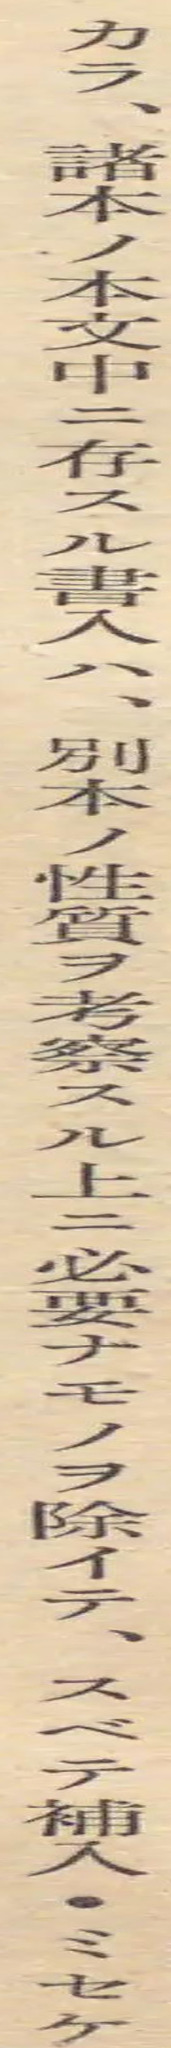カラ、諸本ノ本文中ニ存スル書入ハ、別本ノ性質ヲ考察スル上ニ必要ナモノヲ除イテ、スベテ補入・ミセケ
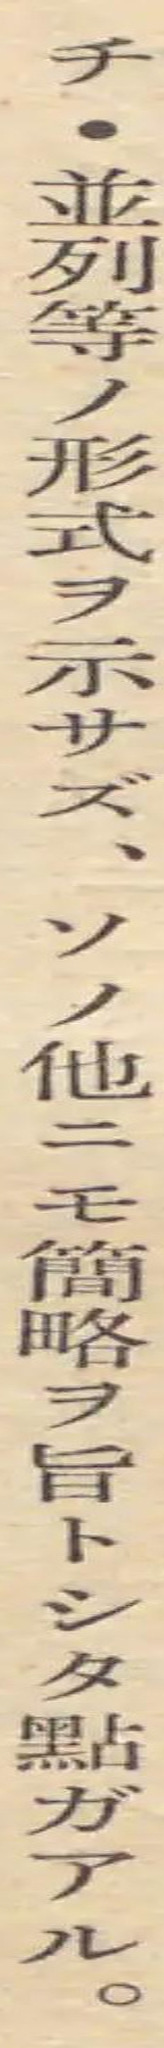チ・並列等ノ形式ヲ示サズ、ソノ他ニモ簡略ヲ旨トシタ点ガアル。
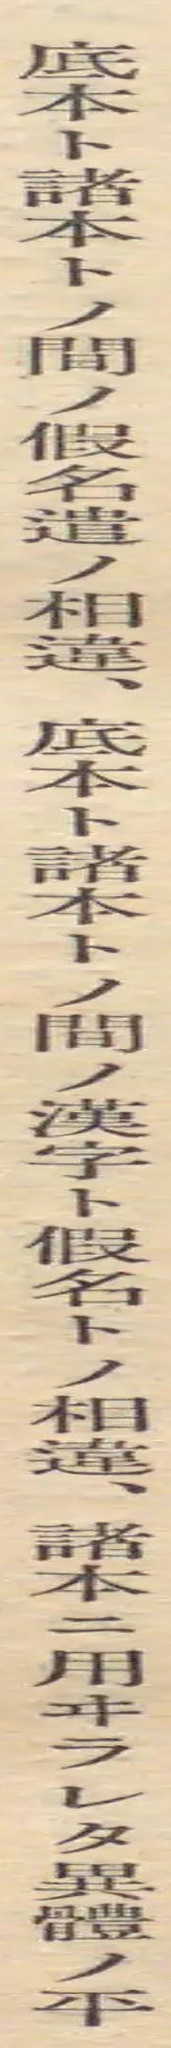一底本ト諸本トノ間ノ仮名遣ノ相違、底本ト諸本トノ間ノ漢字ト仮名トノ相違、諸本ニ用ヰラレタ異体ノ平
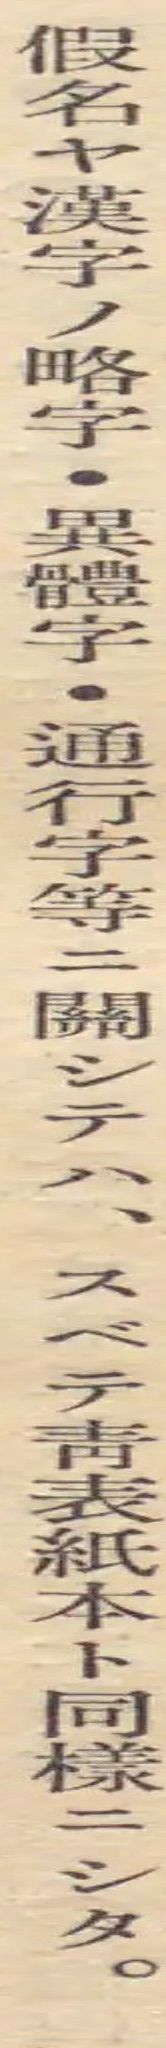仮名ヤ漢字ノ略字・異体字・通行字等ニ関シテハ、スベテ青表紙本ト同様ニシタ。
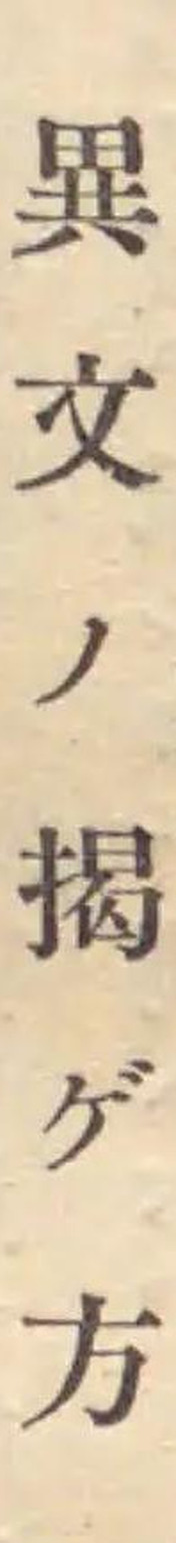異文ノ掲ゲ方
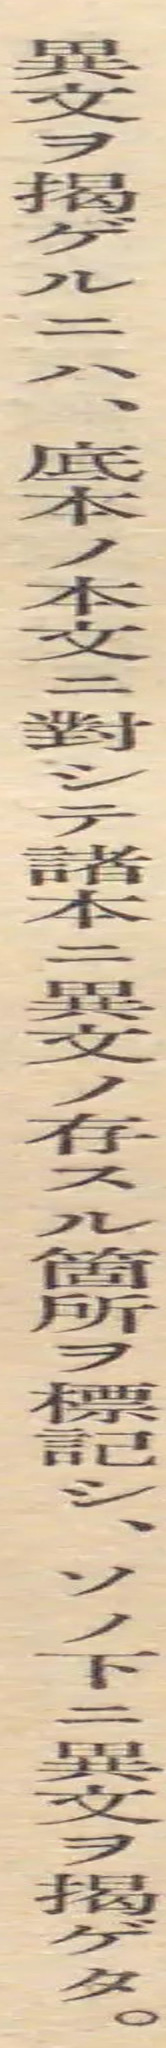異文ヲ掲ゲルニハ、底本ノ本文ニ対シテ諸本ニ異文ノ存スル箇所ヲ標記シ、ソノ下ニ異文ヲ掲ゲタ。
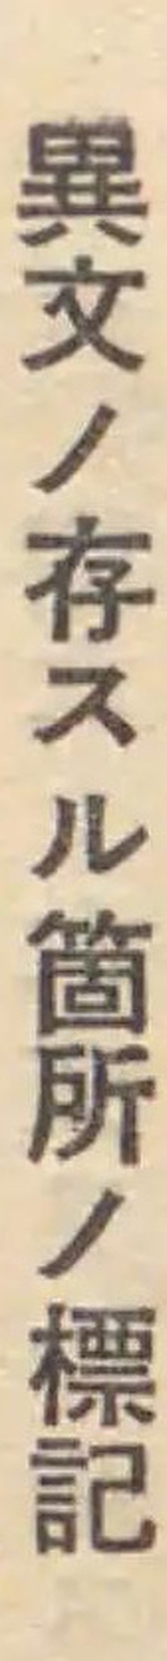異文ノ存スル箇所ノ標記
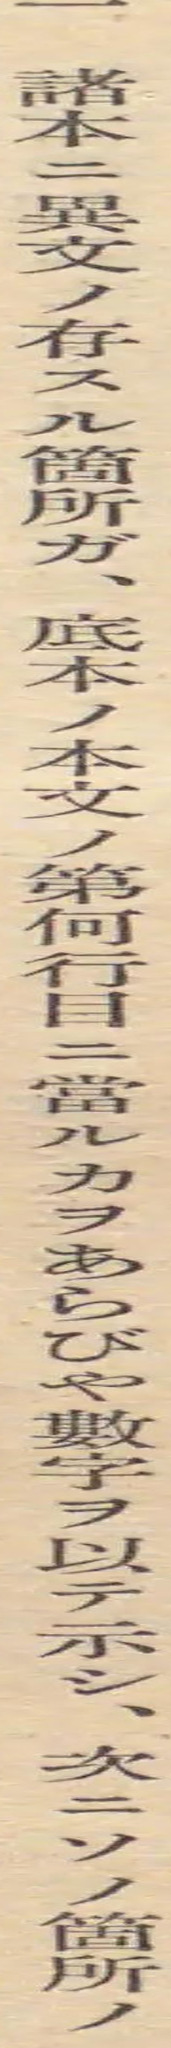一諸本ニ異文ノ存スル箇所ガ、底本ノ本文ノ第何行目ニ当ルカヲあらびや数字ヲ以テ示シ、次ニソノ箇所ノ
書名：校異源氏物語.
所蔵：国立国会図書館 National Diet Library, JAPAN
